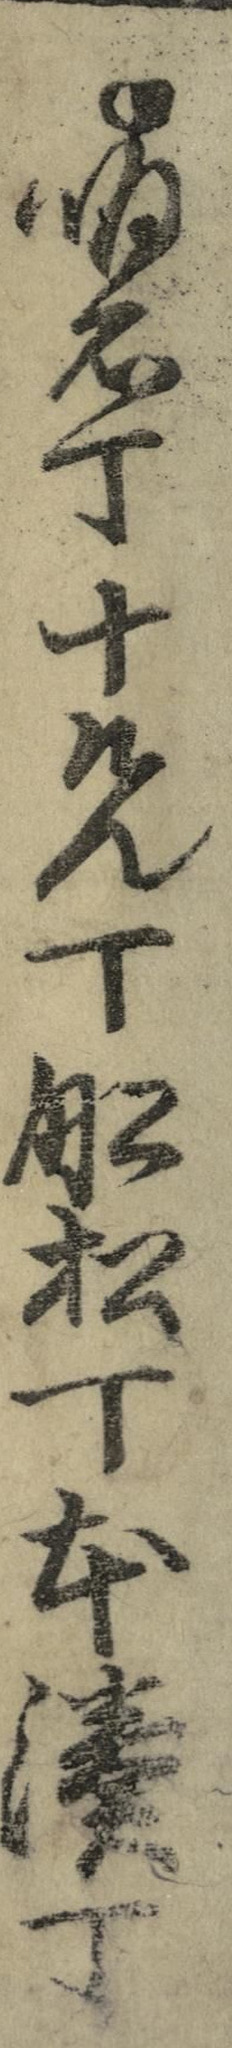明石丁十けん丁船松丁本湊丁
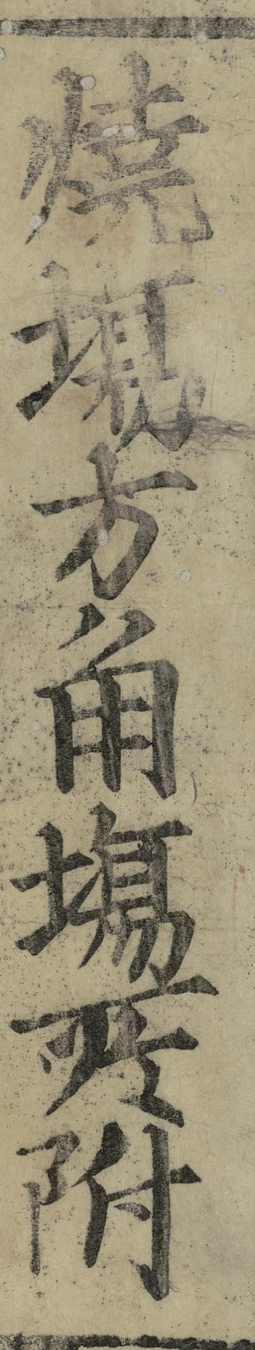焼場方角場所附
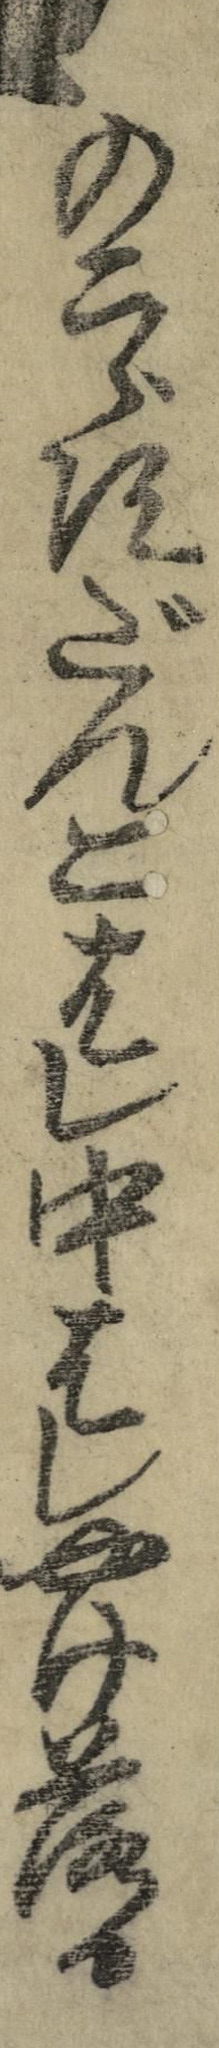のこらずだんこばし中はしやけ落る
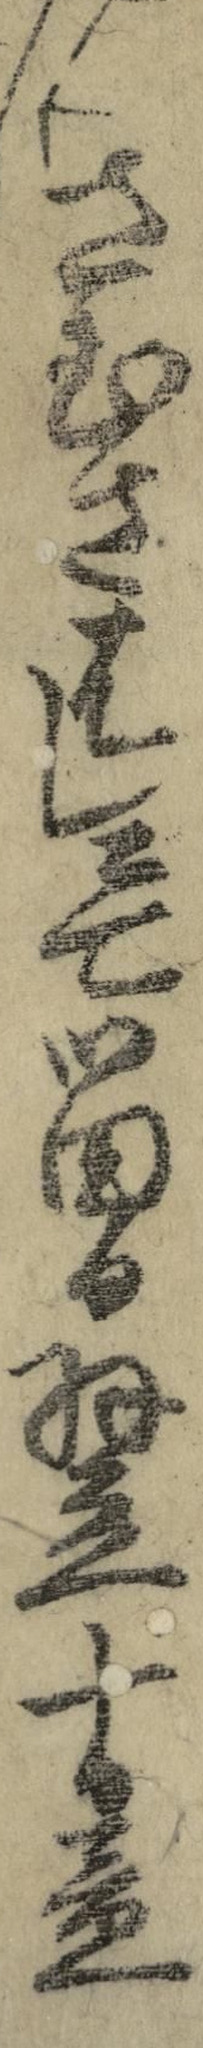さむさはし二て留る翌十日昼
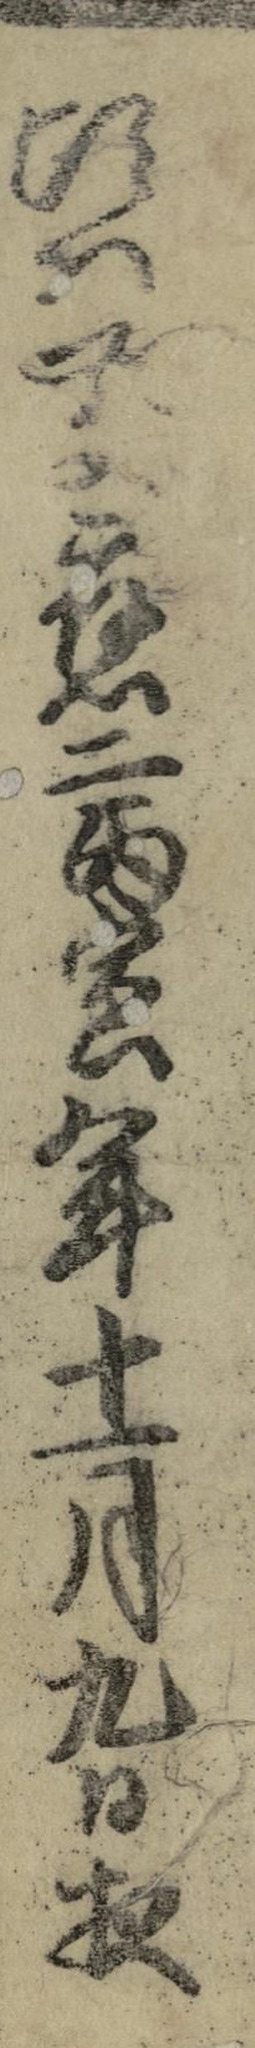頃ハ慶応二丙寅年十一月九日夜
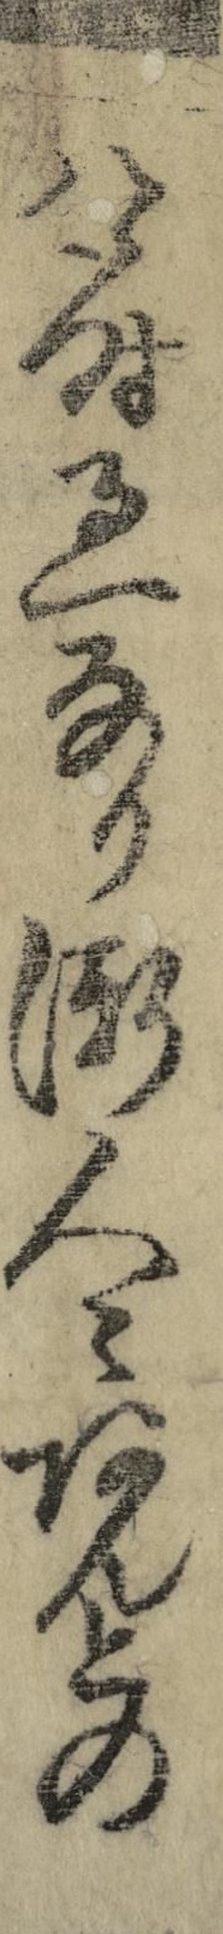八ッ時過なり漸人々あんとの
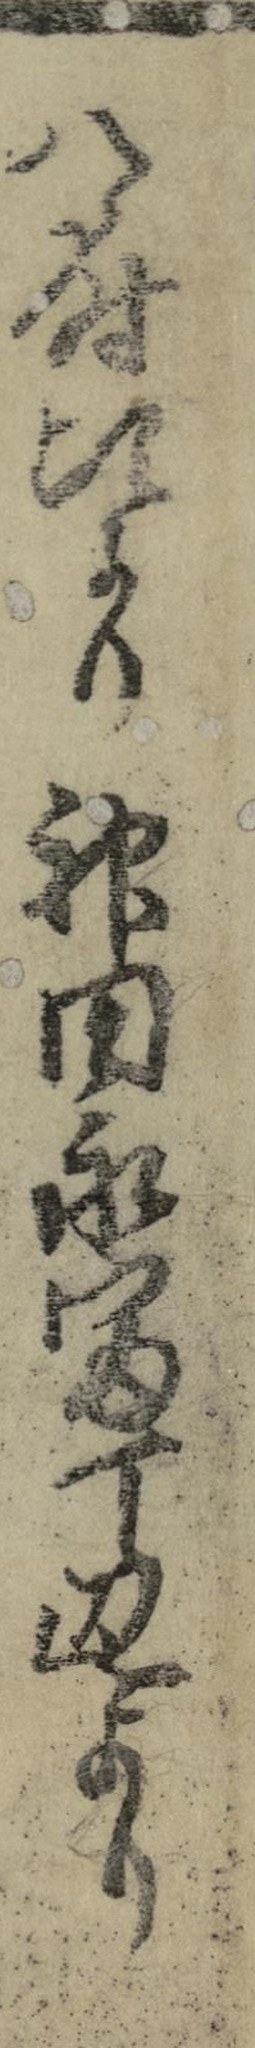八ッ時頃より神田永富丁辺より
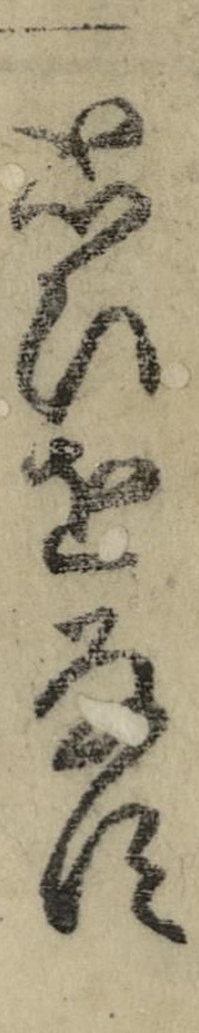思ひをなす
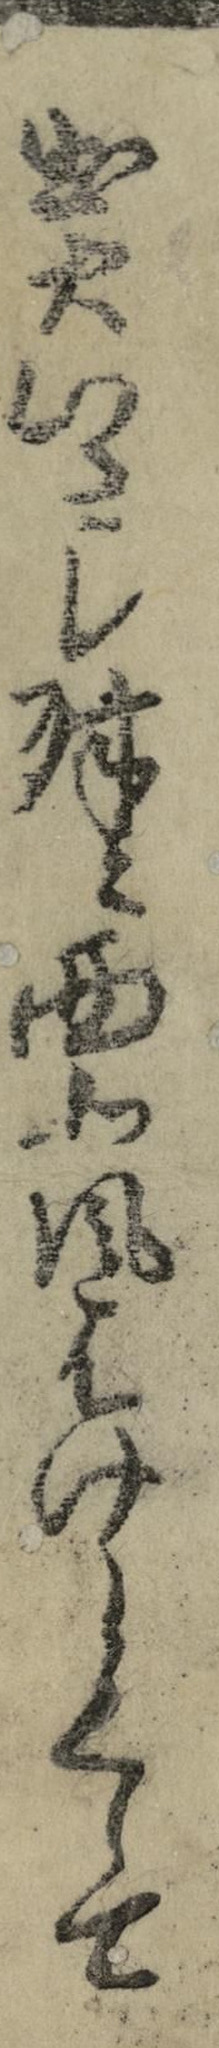出火いたし殊二西北風はけしくして
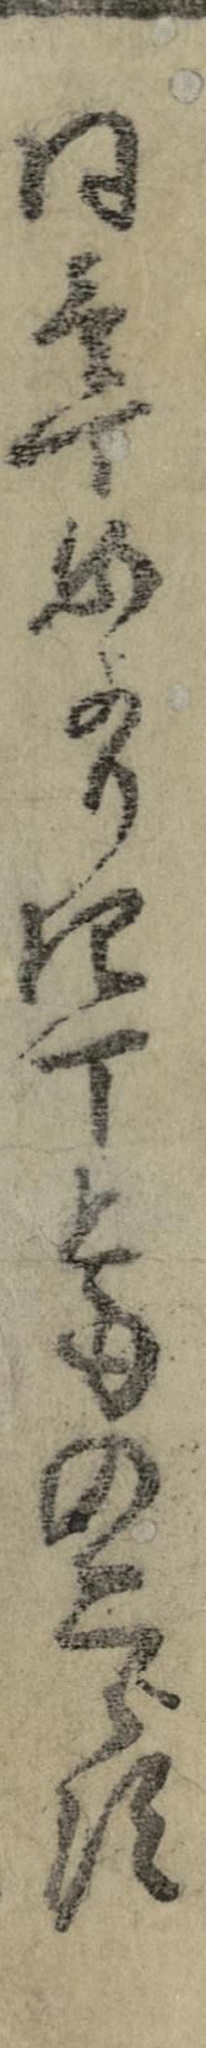同壱丁めより四丁とものこらず
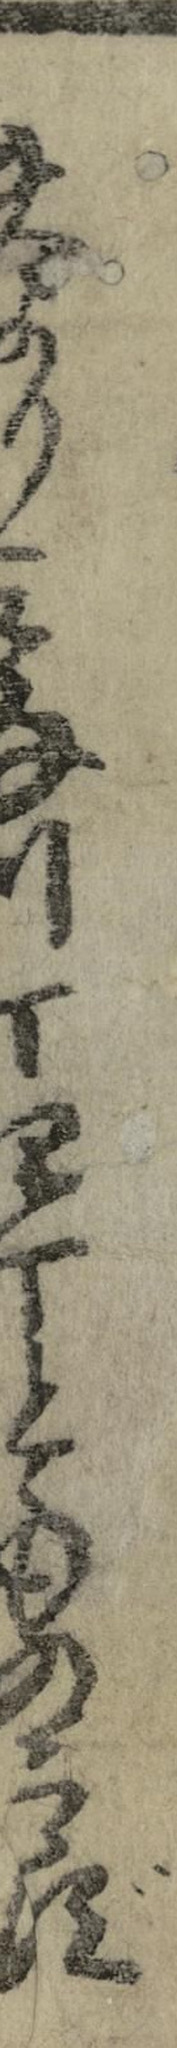夫よりミな川丁四丁とものこらず
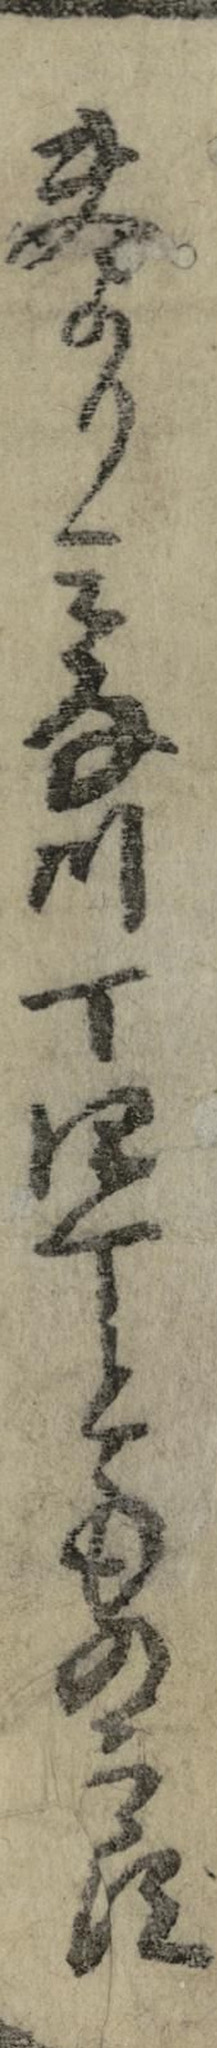夫よりミな川丁四丁とものこらず
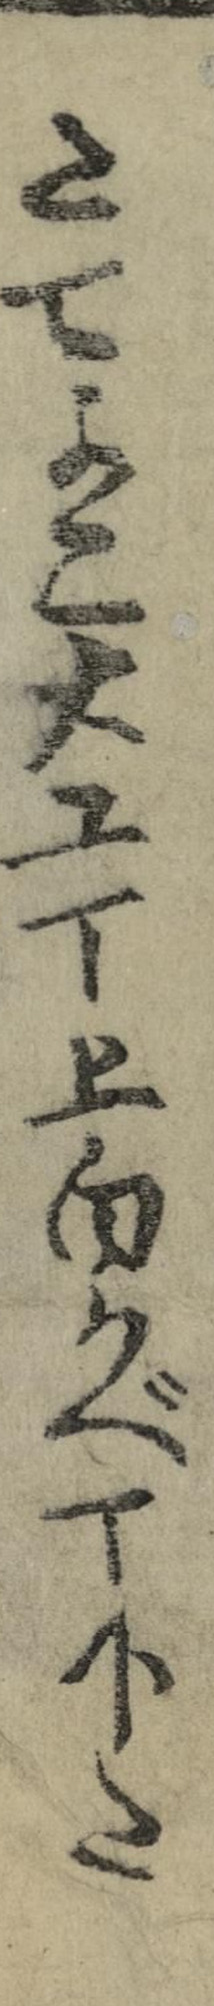たてよこ大工丁上白かべ丁下た
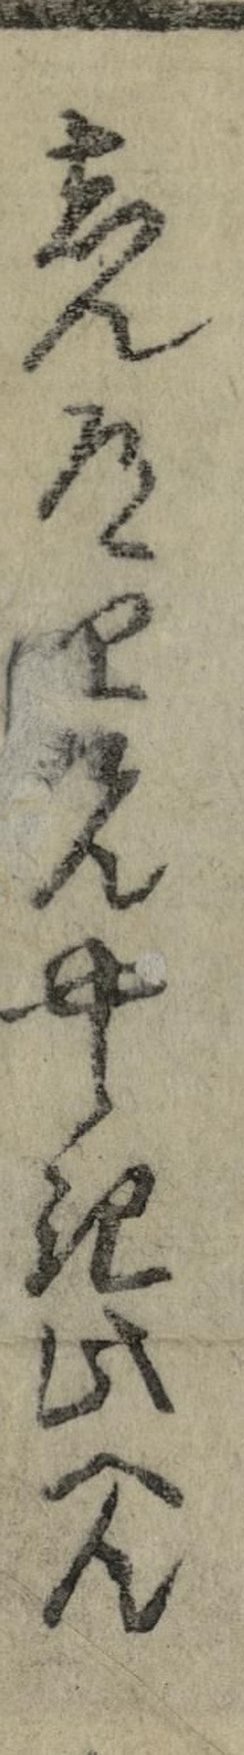しん道四けんやしき此へん
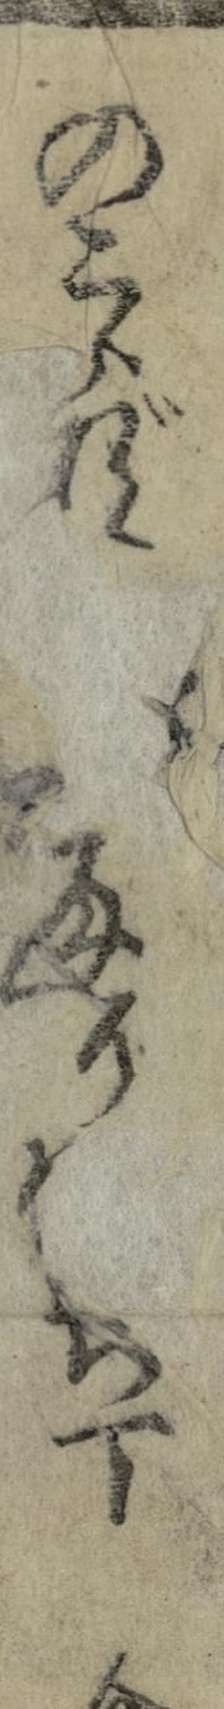のこらず通り丁
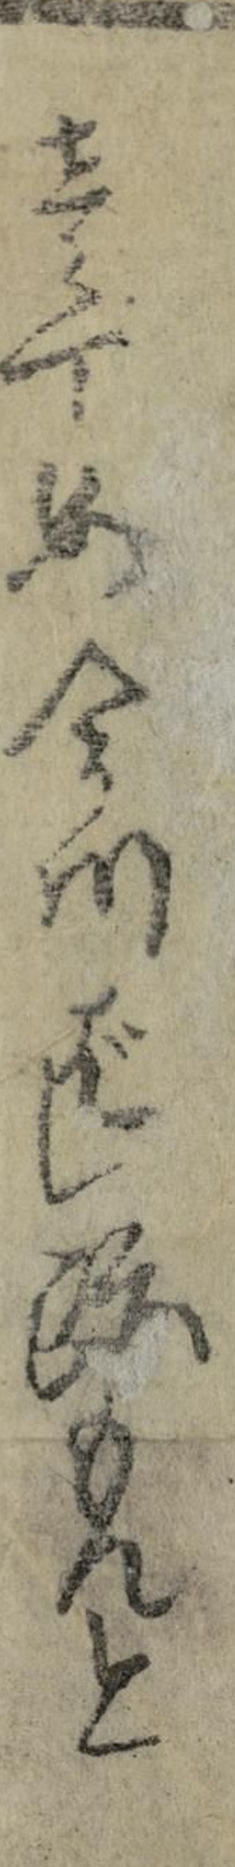壱丁め今川ばし跡もんと
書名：焼場方角場所附
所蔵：東京大学地震研究所図書室 Earthquake Research Institute Library, The University of Tokyo, JAPAN
